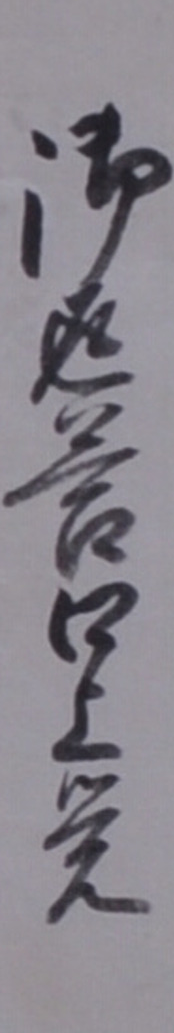御返答口上覚
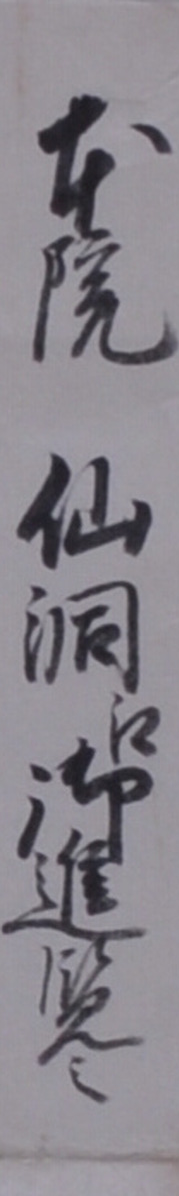本院仙洞え御進覧之
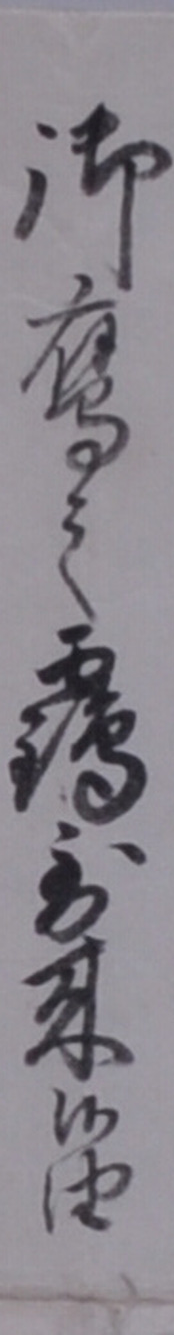御鷹之靏到来候由
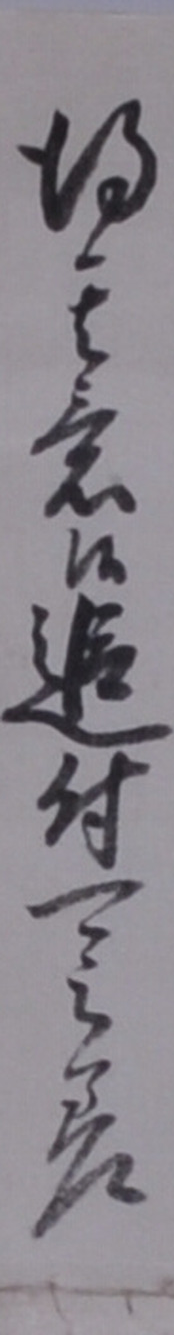絵其意候追付可令差
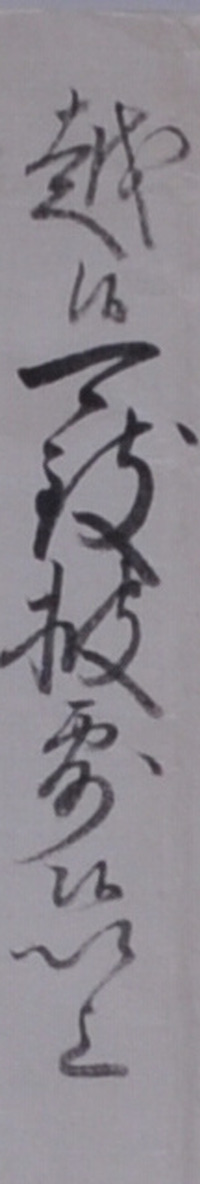越候可致披露候以上
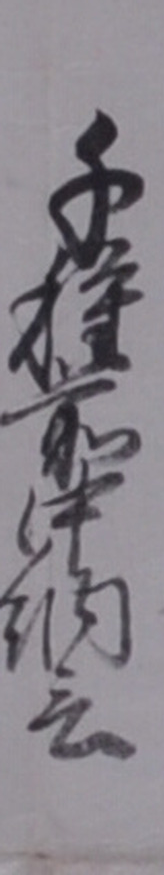千種前中納言
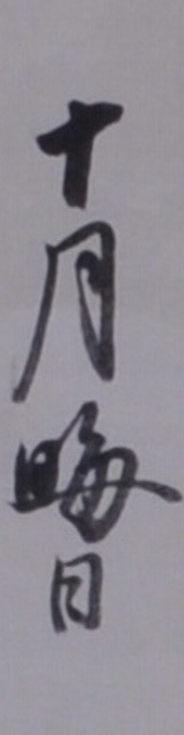十月晦日
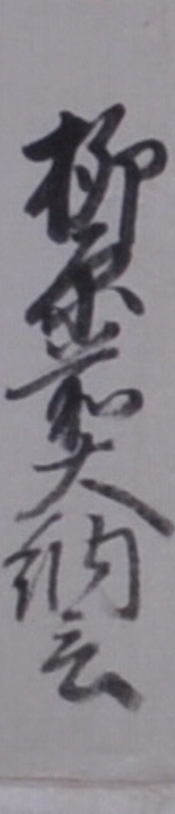柳原前大納言
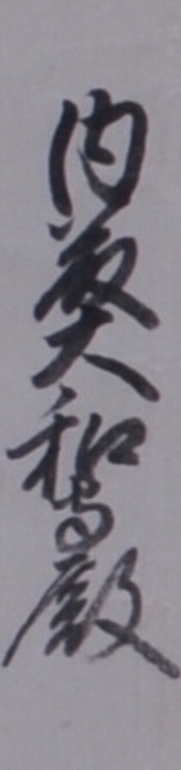内藤大和守殿
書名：御返答口上覚
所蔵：伊那市立高遠町図書館・合同会社AMANE
